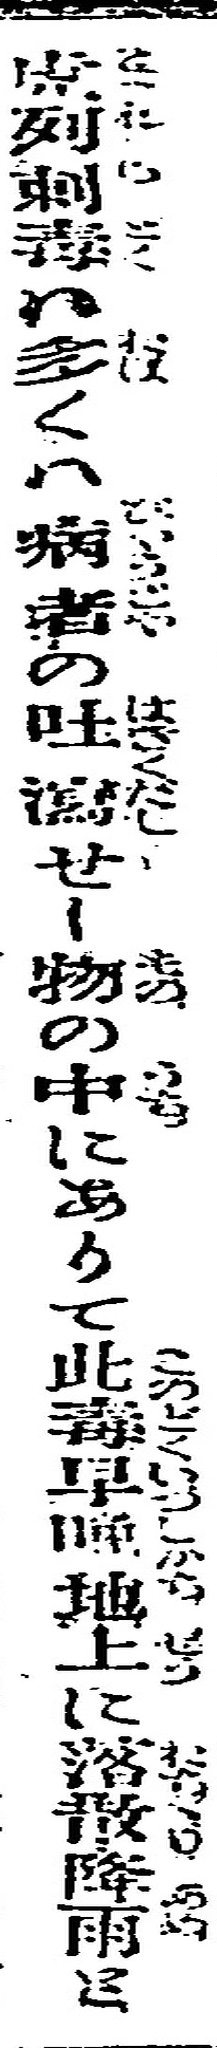虎列刺毒は多くは病者の吐瀉せし物の中にありて此毒早晩地上に落散降雨と
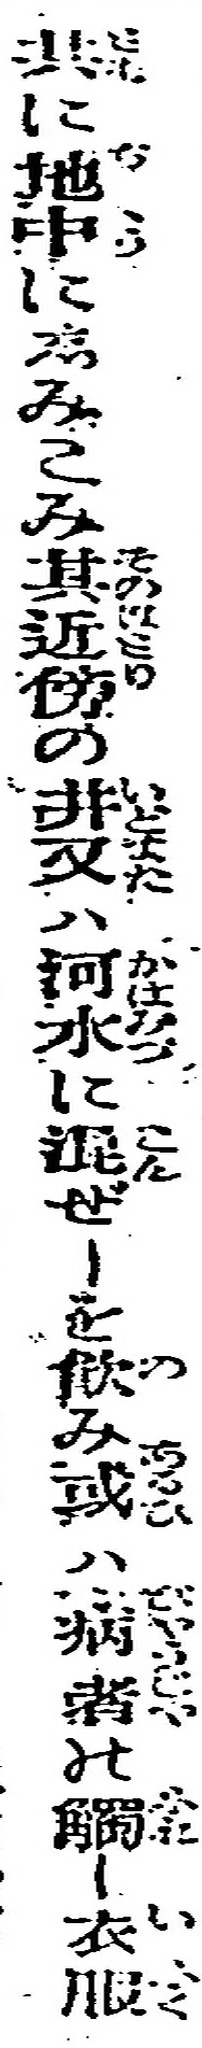共に地中にしみこみ其近傍の井又は河水に混ぜしを飲み或は病者の觸し衣服
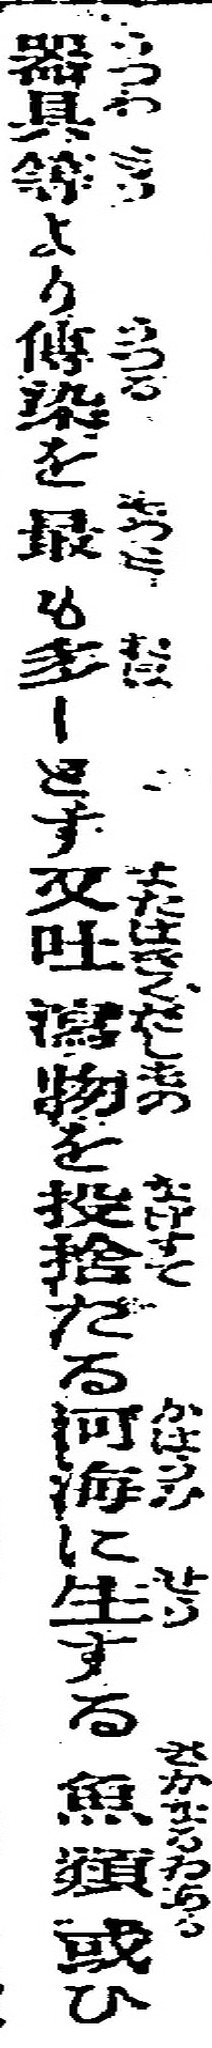器具等より傳染を最も多しとす又吐瀉物を投捨たる河海に生する魚類或ひ
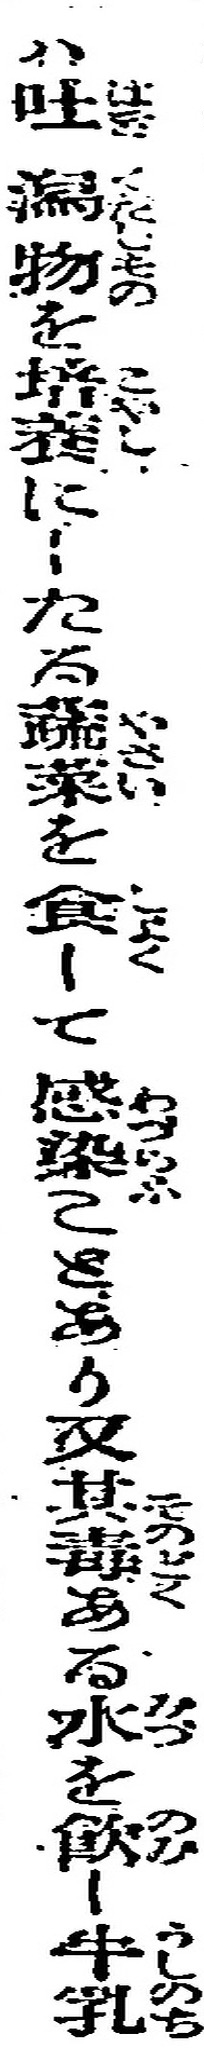は吐瀉物を培養にしたる蔬菜を食して感染ことあり又其毒ある水を飲し牛乳
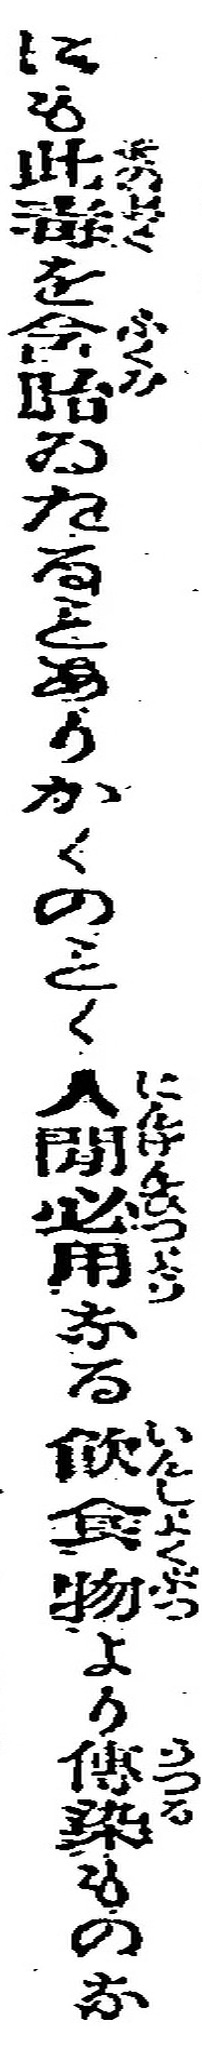に此毒を含胎ゐたることありかくのことく人間必要なる飲食物より傳染ものな
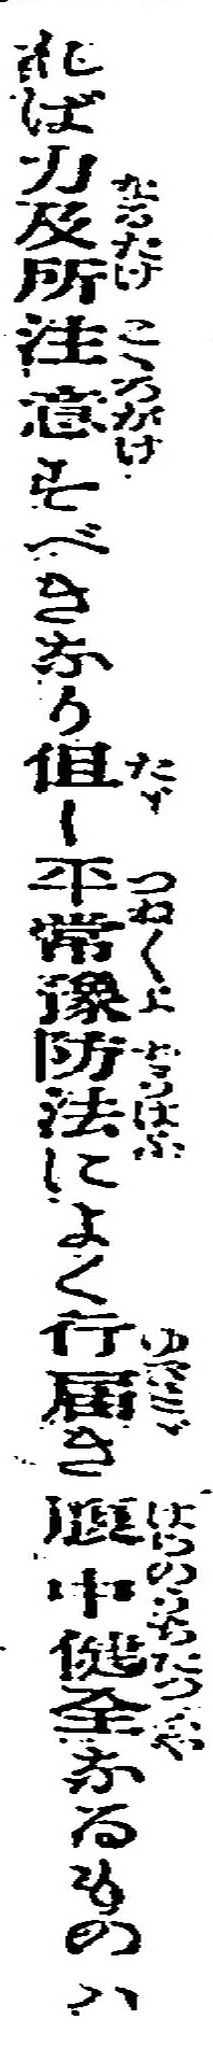れば力及所注意すべきなり但し平常豫防法によく行届き腹中健全なるものは

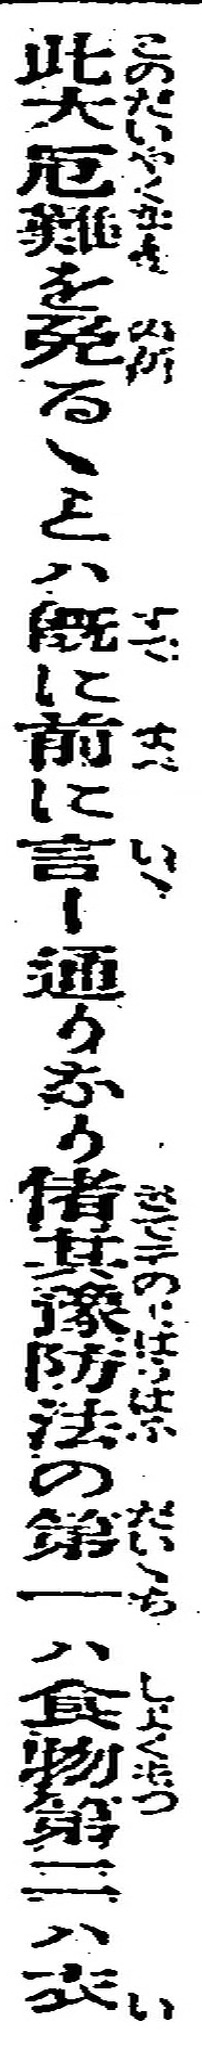此大厄難を免るゝことは既に前に言し通りなり偖其豫防法の第一は食物第二は衣
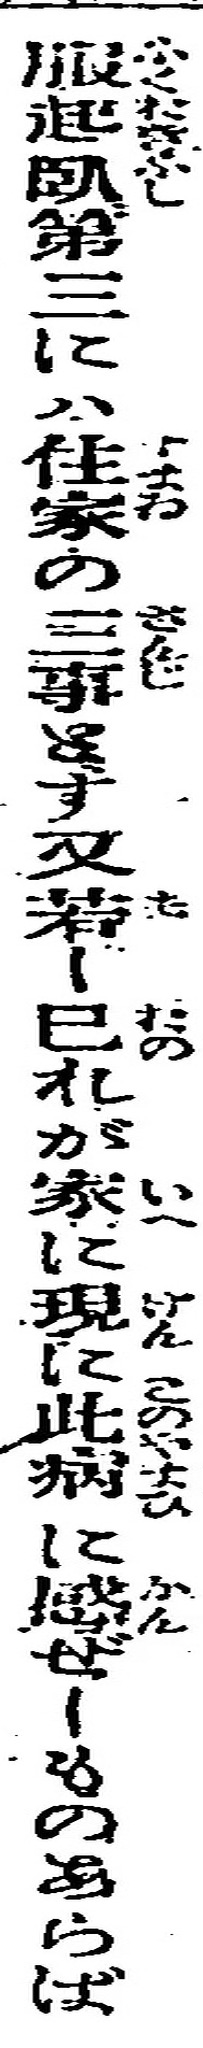服起臥第三には住家の三事とす又若し己れが家に現に此病に感ぜしものあらば
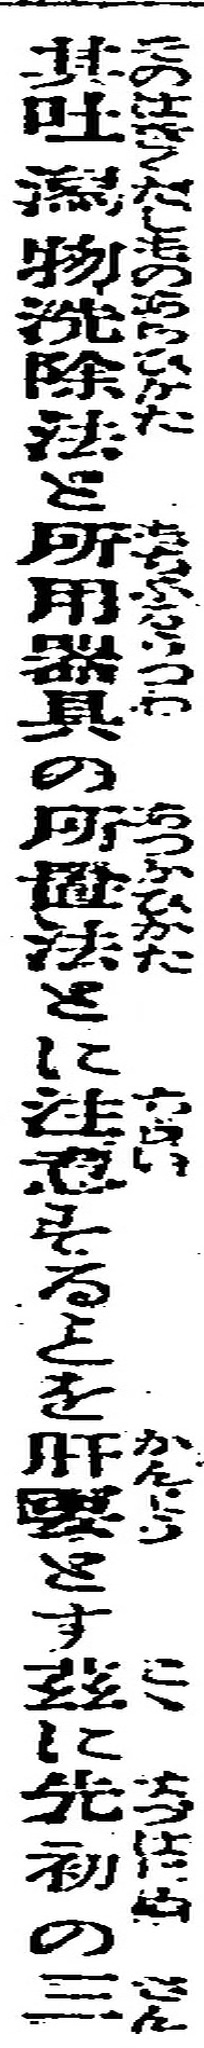其吐瀉物洗除法と所用器具の所置法とに注意することを肝要とす茲に先初の三
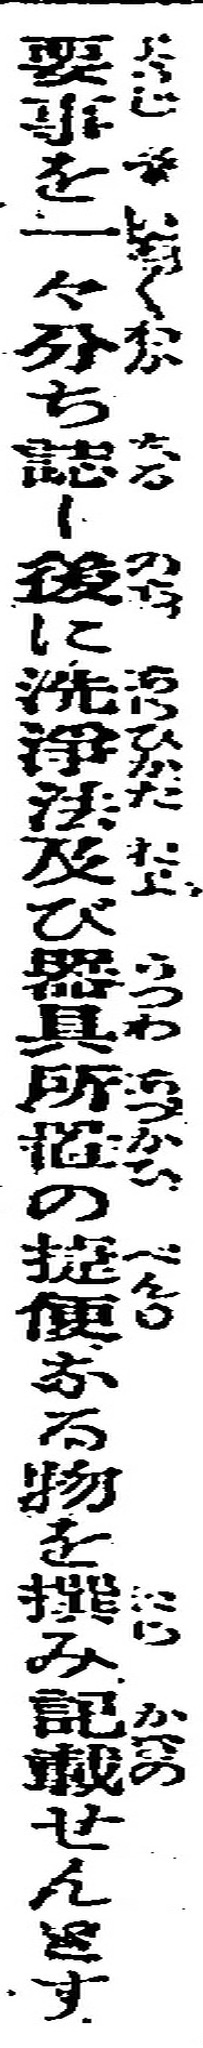要事を一々分ち誌し後に洗浄法及び器具所置の捷便なる物を撰み記載せんとす
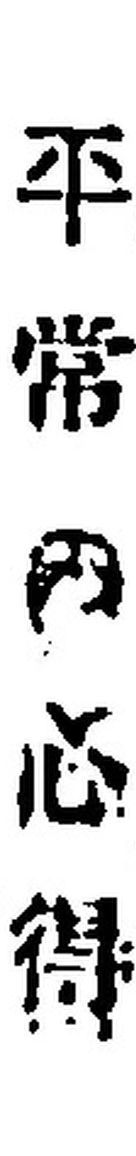平常の心得
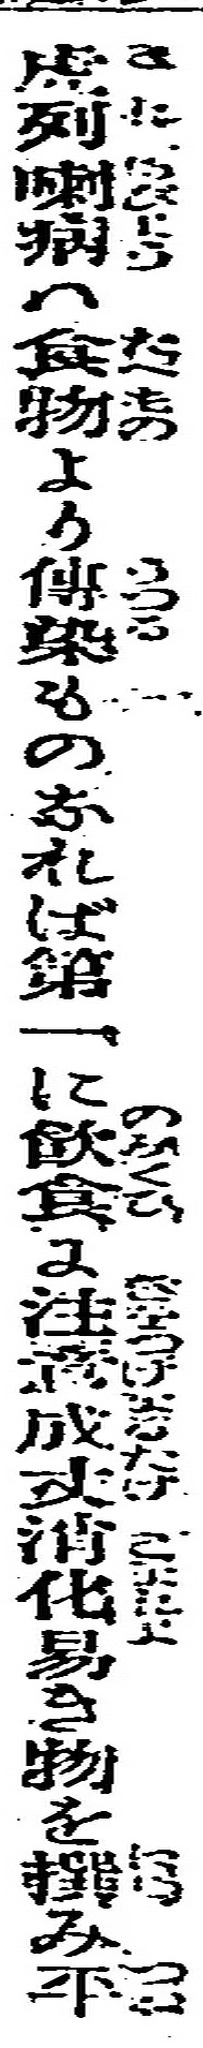虎列刺病は食物より傳染ものなれば第一に飲食に注意成丈消化易き物を撰み平
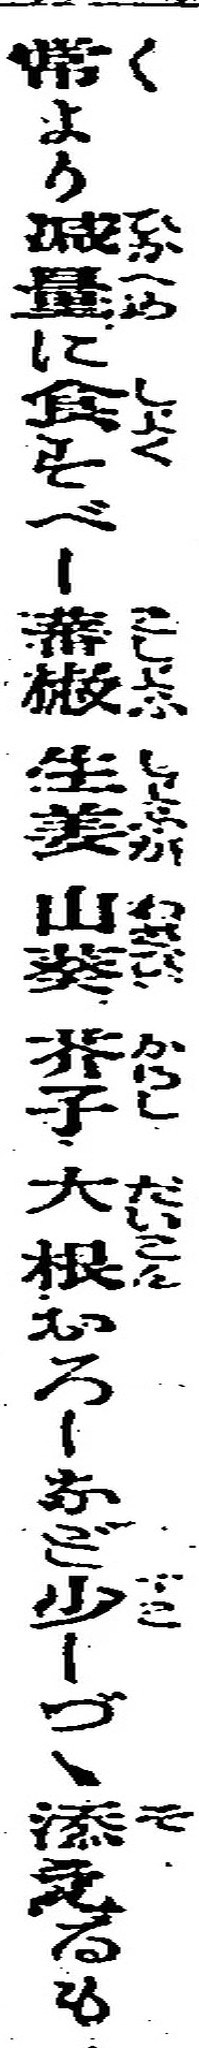常より減量に食すべし蕃椒生姜山葵芥子大根おろしなど少しづゝ添えるも
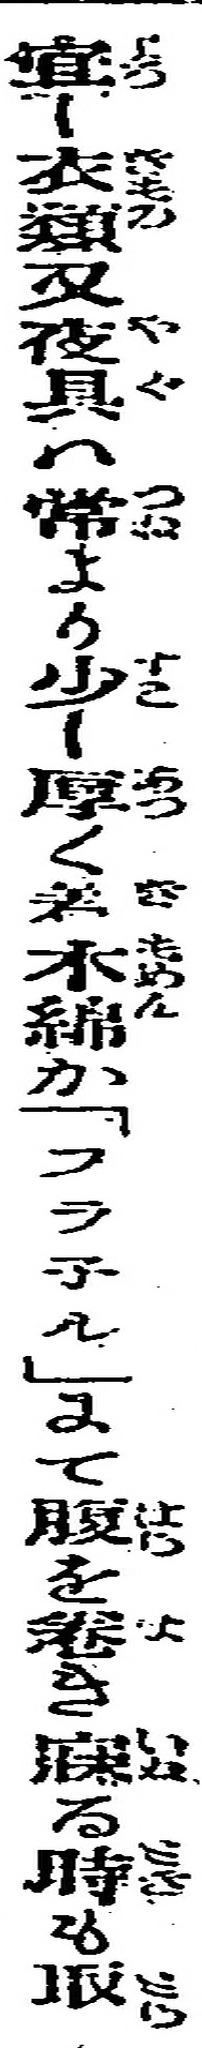宜し衣類又夜具は常より少し厚く着木綿か「フラネル」にて腹を巻き寝る時も取
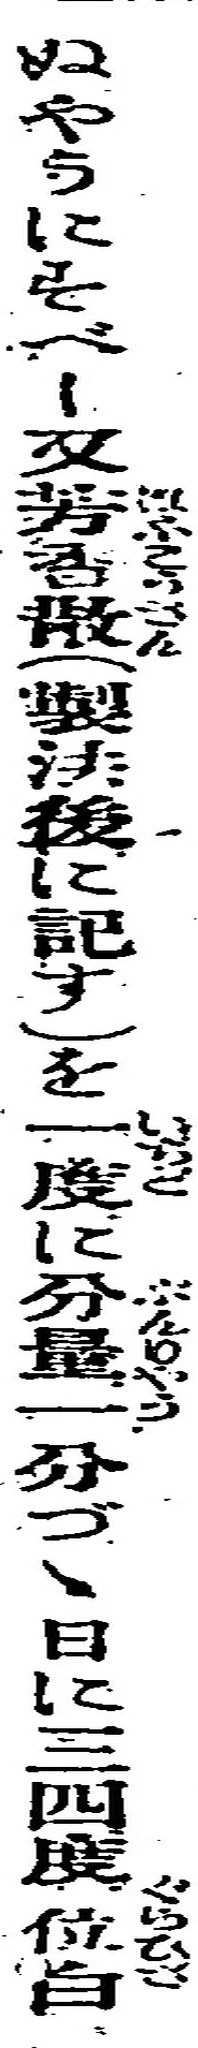ぬやうにすべし又芳香散[製法後に記す]を一度に分量一分づゝ日に三四度位白
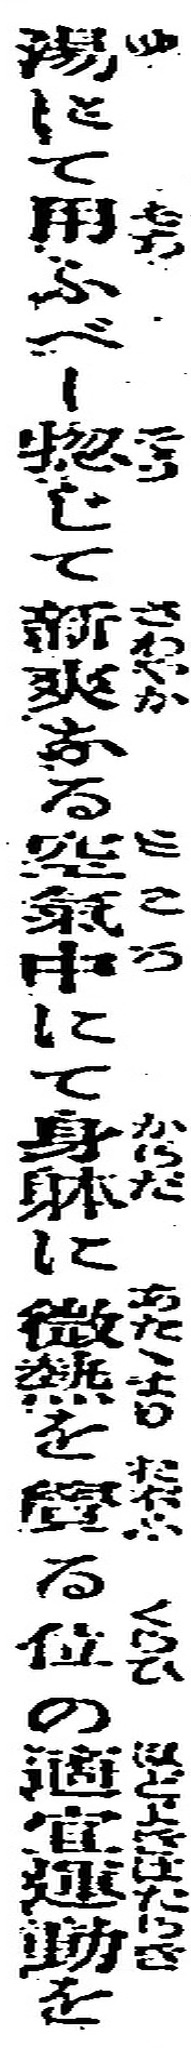湯にて用ふべし惣じて新爽なる空氣中にて身躰に微熱を覚る位の適宜運動を
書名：虎列剌病予防養生法訳解
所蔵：国立国会図書館 National Diet Library, JAPAN
